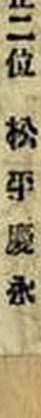松平慶永
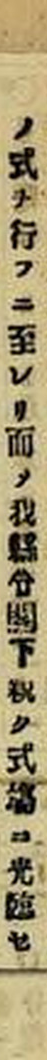ノ式ヲ行フニ至レリ而テ我県令閣下親ク式場ニ光臨セ
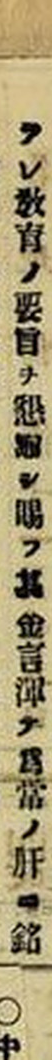ラレ教育ノ要旨ヲ懇望シ賜フ其金言渾テ日常ノ肝ニ銘
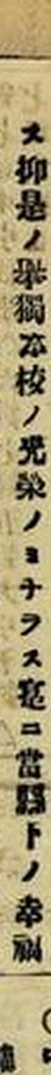ス抑是ノ挙独本校ノ光栄ノミナラス寔ニ当県下ノ幸福
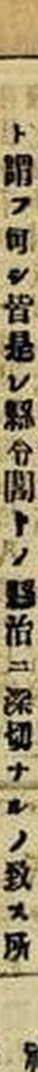ト謂フ可シ皆是レ県令閣下ノ県治ニ深切ナルノ致ス所
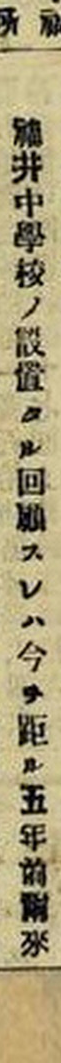福井中学校ノ設置タル回顧スレハ今ヲ距ル五年前而来
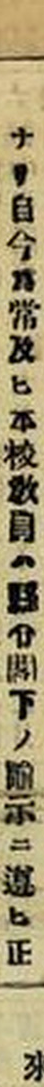ナリ自今日常及ヒ本校教員ハ県令閣下ノ諭示ニ遵ヒ正
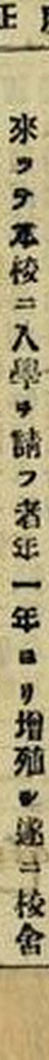来ツテ本校ニ入学ヲ請フ者年一年ヨリ増殖シ遂ニ校舎
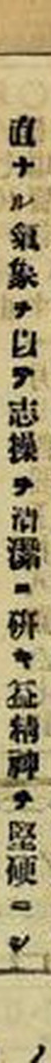直ナル気象ヲ以テ志操ヲ清潔ニ研キ益精神ヲ堅硬ニシ
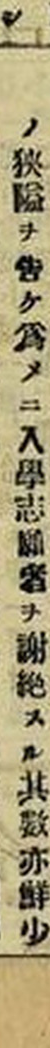ノ狭隘ヲ告ケ為メニ入学志願者ヲ謝絶スル其数亦鮮少
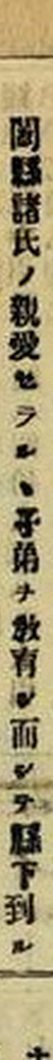闔県諸氏ノ親愛セラルヽ子弟ヲ教育シ而シテ県下到ル
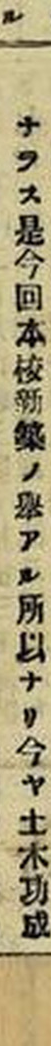ナラス是今回本校新築ノ挙アル所以ナリ今ヤ土木功成
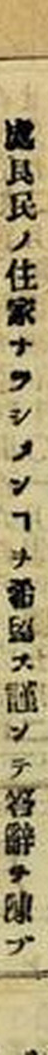処良民ノ住家ナラシメンヿヲ希望ス謹ンテ答辞ヲ陳ブ
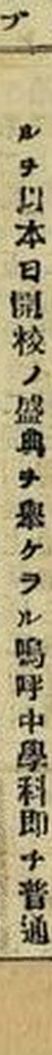ルヲ以本日開校ノ盛典ヲ挙ケラル嗚呼中学科即チ普通
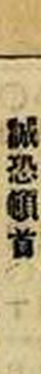誠恐頓首
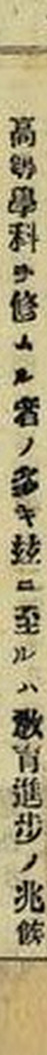高等学科ヲ修ムル者ノ多キ茲ニ至ルハ教育進歩ノ兆候
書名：温古集 五巻
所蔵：福井県文書館 Fukui Prefectural Archives
